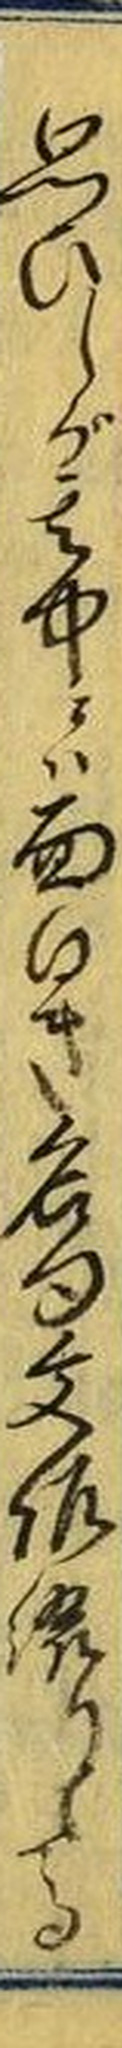思ひしが其中には面白き名句文作綴りたる
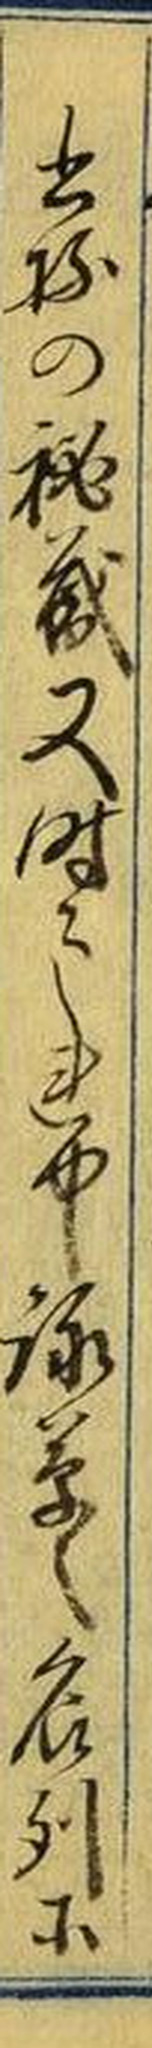書抔の秘蔵又は時々之連中詠草之名列等
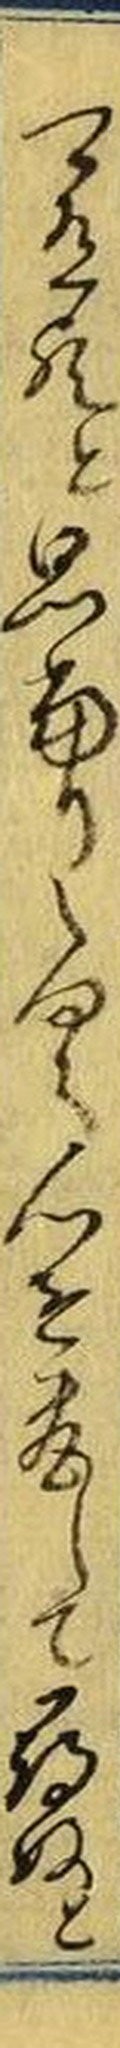可有歟と思当り之句に心を尽してた尋ぬと
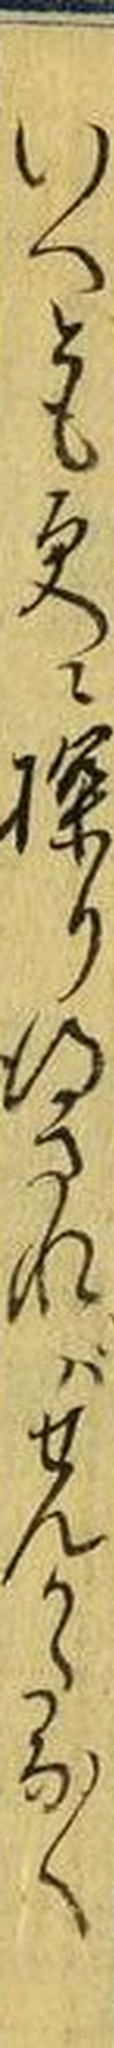いへとも更に探り得さればせんかたなく
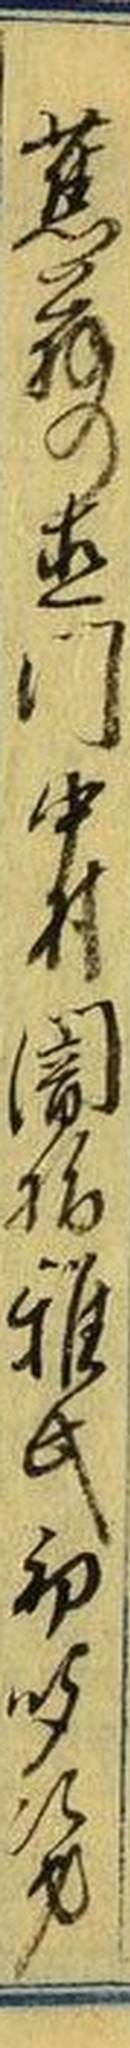蕉翁の直門中村闇指雅氏初聞次第
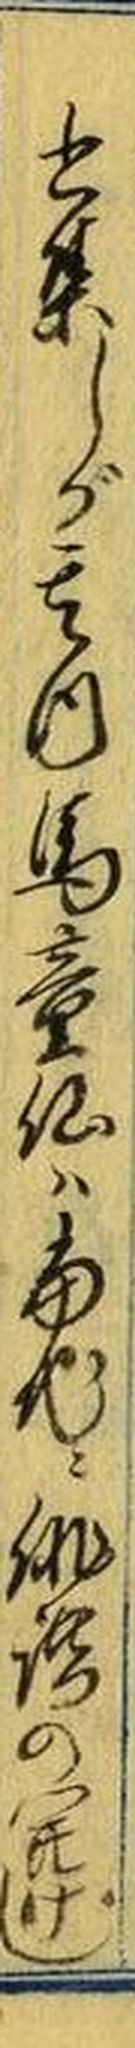書集しが其内馬童仙は当地に俳諧の開けし
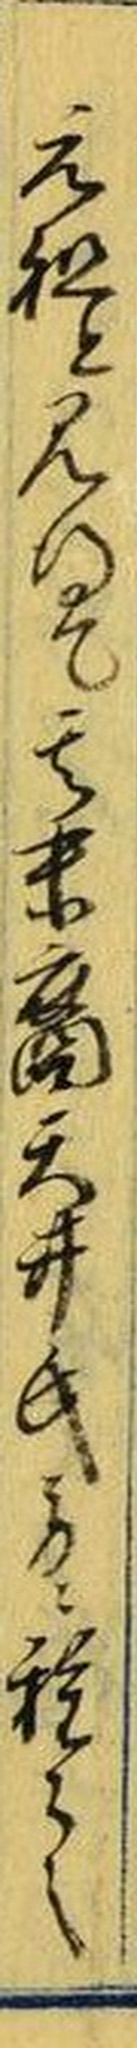元祖と見得て其末裔天井氏方に種々之
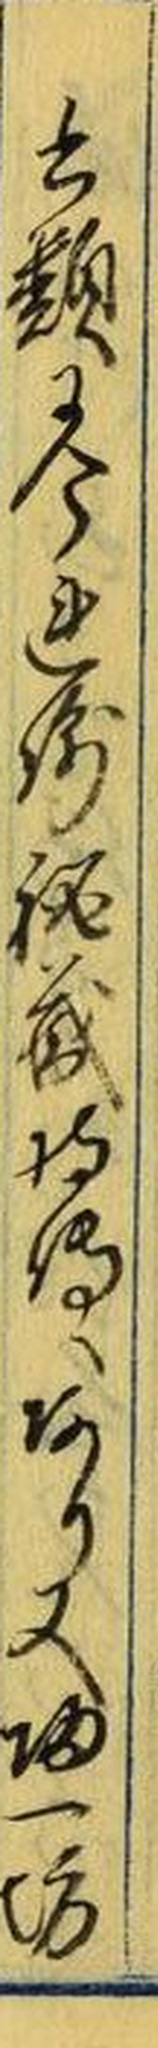書類于今連綿秘蔵持伝へあり又帰一坊
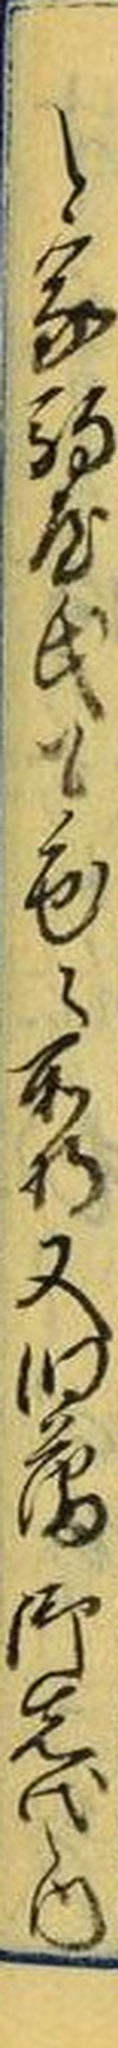之家駒屋氏も色々所持又旧藩御先代之内
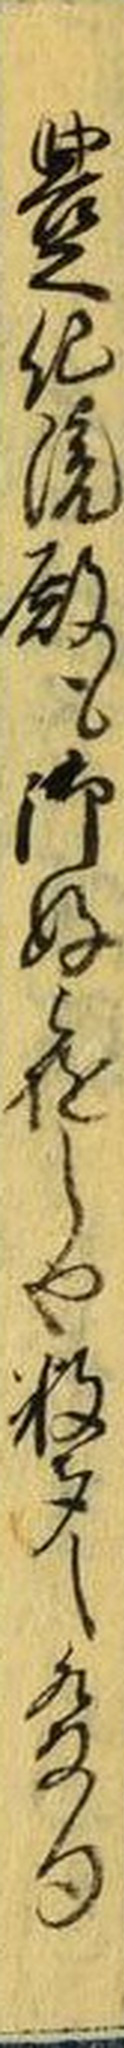豊仙院殿も御好被遊しや数多之発句
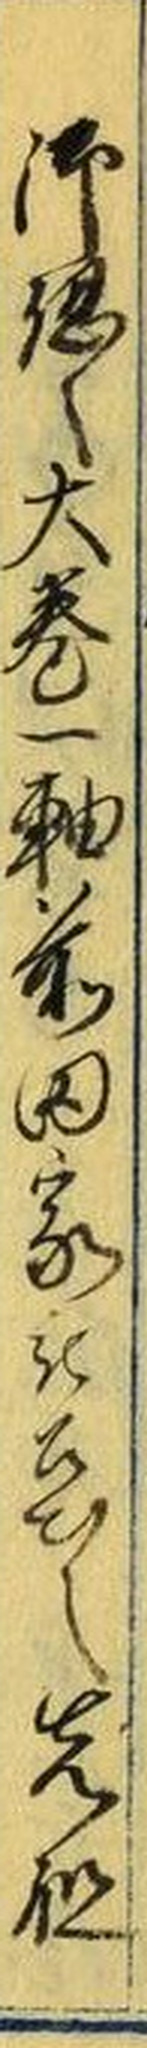御認之大巻一軸前田家被召出之先祖
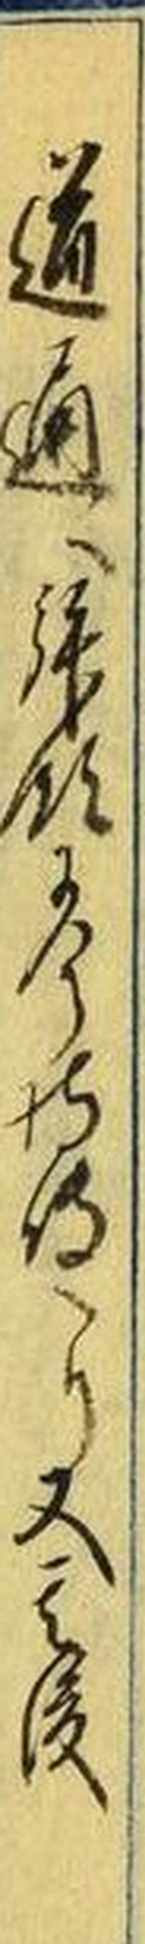道通へ拝領于今持伝へり又其後
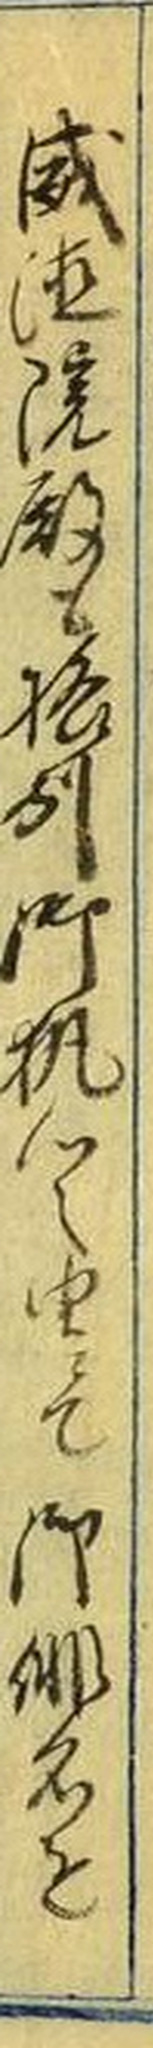威徳院殿も格別御執心之由にて御俳号を
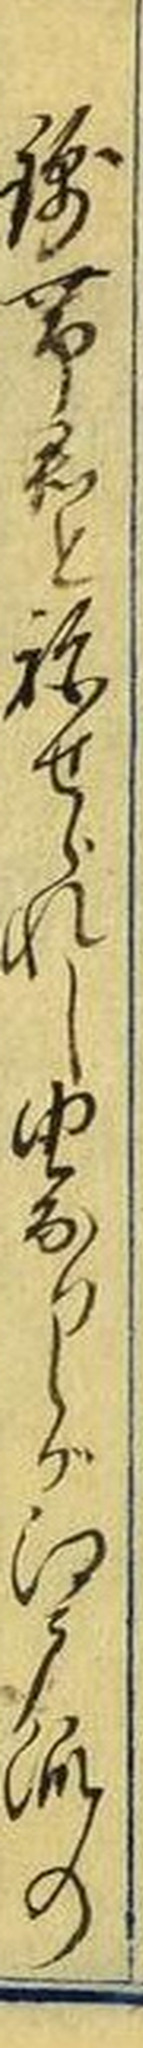錦帯君と称せられし由なりしが江戸流の
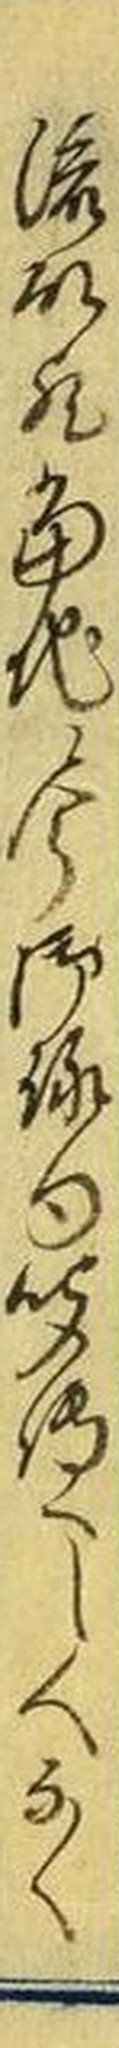流故歟当地に今御詠句聞伝へし人なく
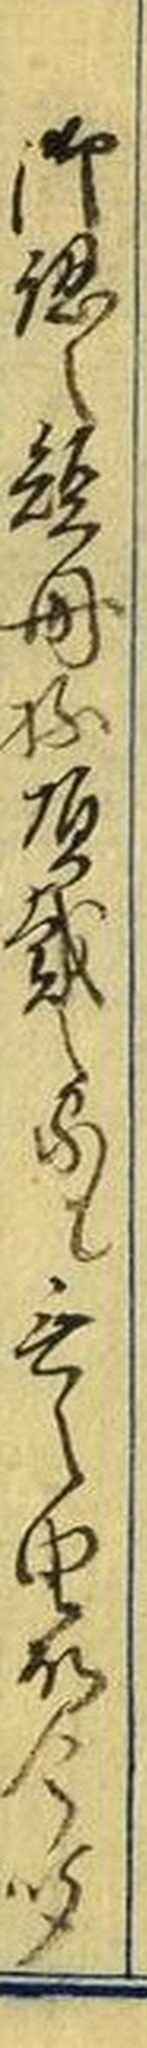御認之短冊抔頂戴し家も無之由故今聞
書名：温古集 三巻
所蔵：福井県文書館 Fukui Prefectural Archives
